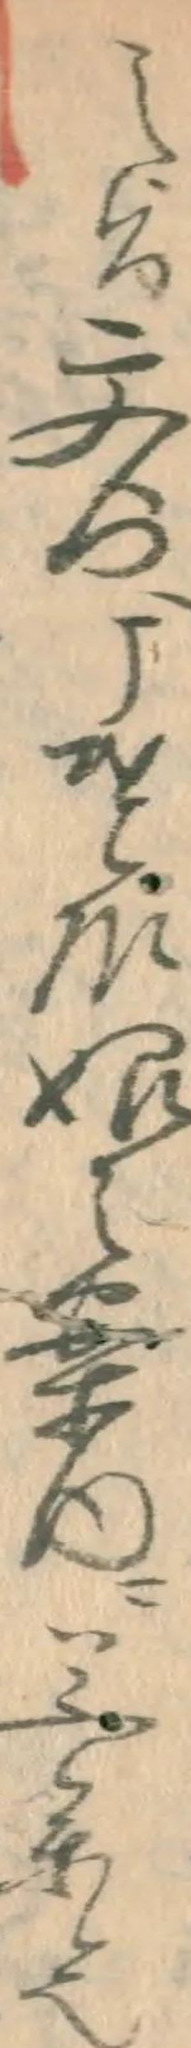之旨文右衛門へ申遣候故始之案内ニハ不参候也
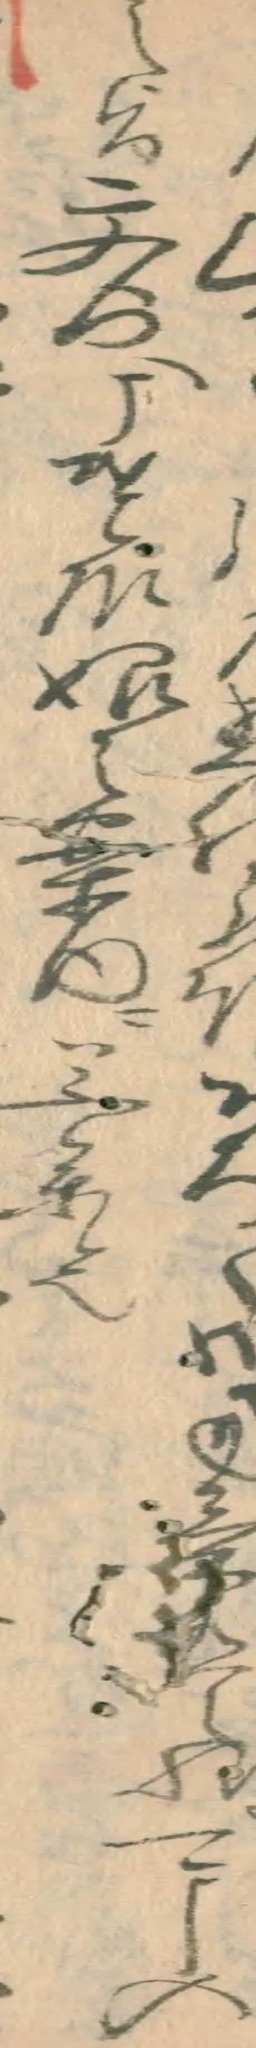之旨文右衛門へ申遣候故始之案内ニハ不参候也
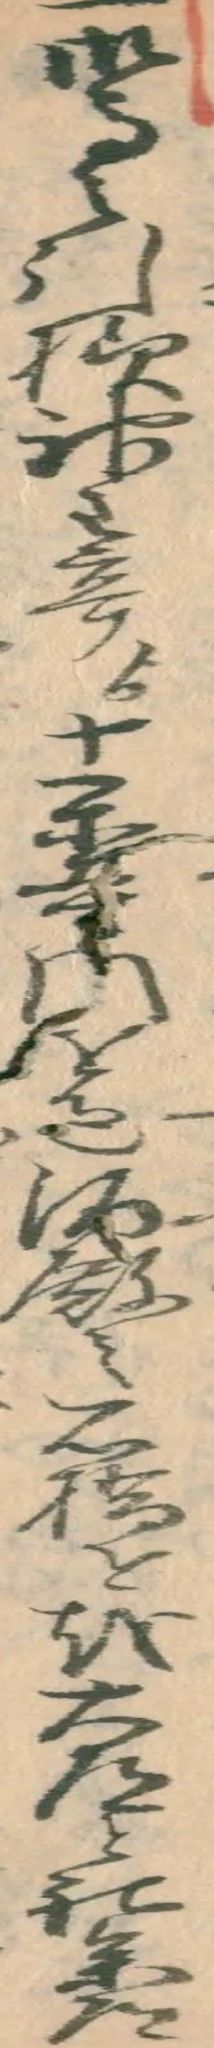一御馬之引様神主亭ゟ十楽寺門を過酒殿之石橋を越大道と社参道
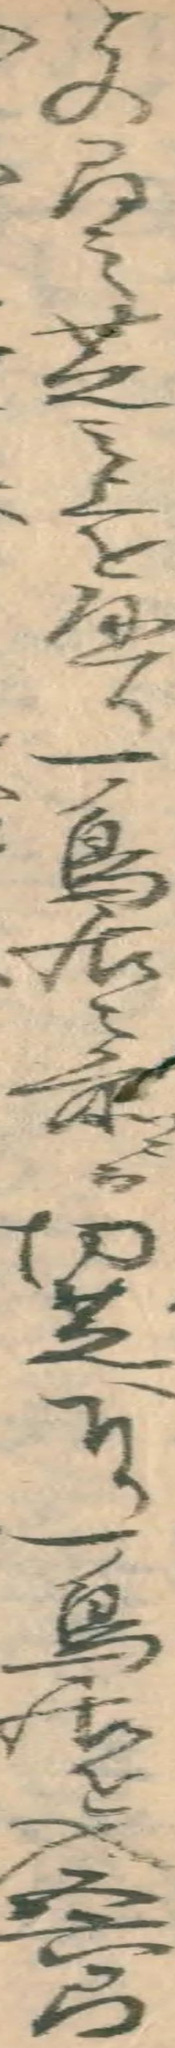との間之芝之上を通り一ノ鳥居之前ニ而切芝へ下り一ノ鳥居を入五六間
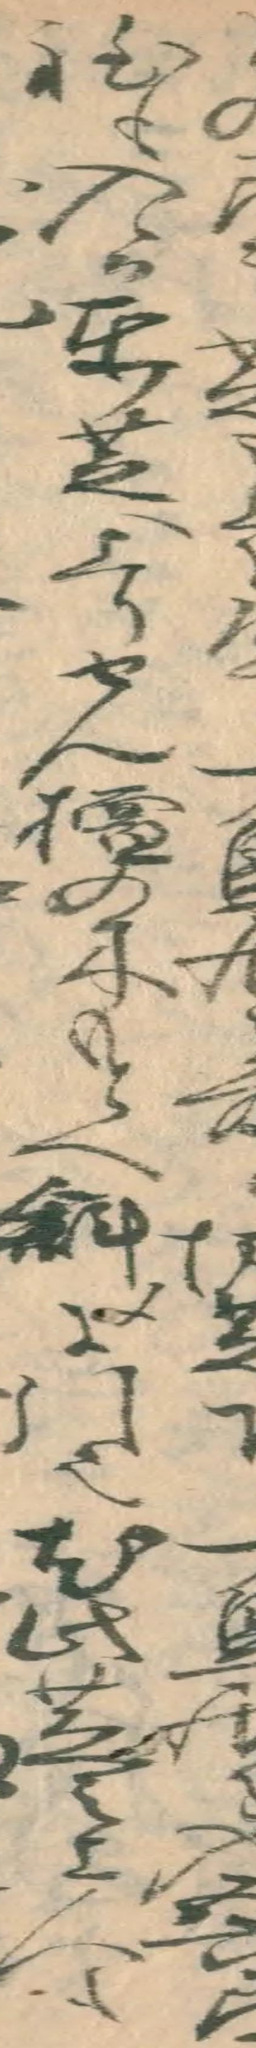程も入候而東ノ芝へ上りセん檀の木もとへ斜メに引也尤此芝之上人も
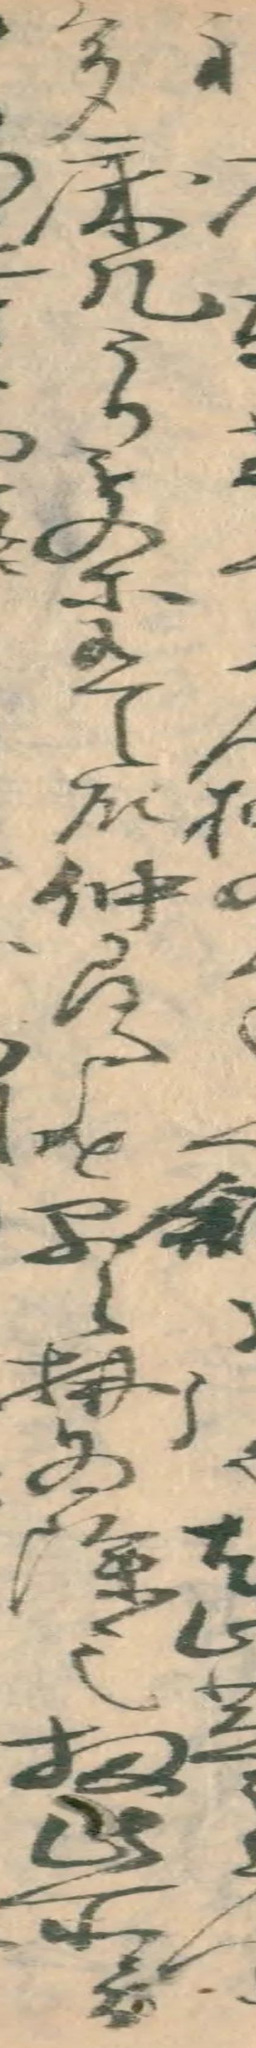多床札うりもの等有之故仲間へ申遣早々払為除候也扨此所ニ而
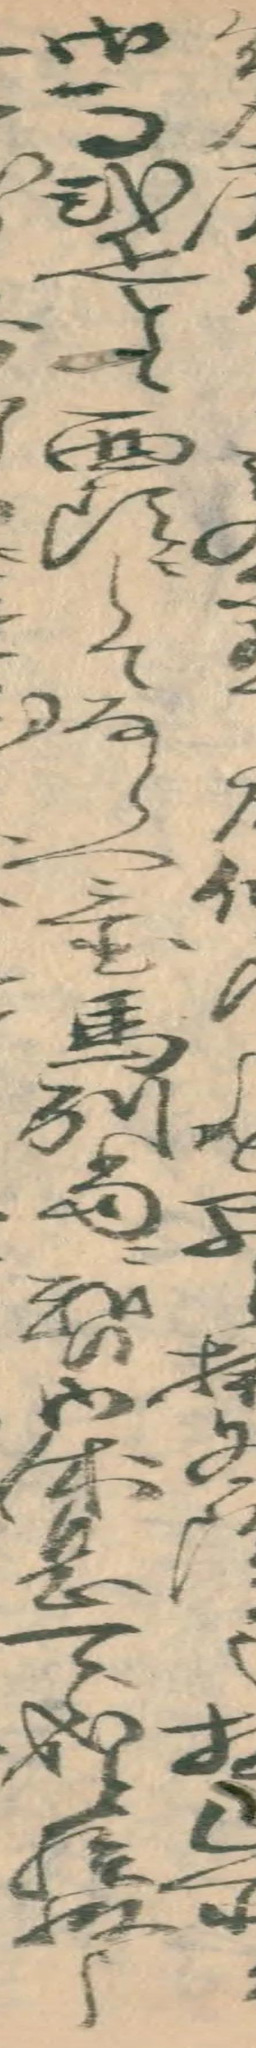御馬弐疋とも西頭ニしてならへ置馬別当ニ暫御体息可被成と挨拶申
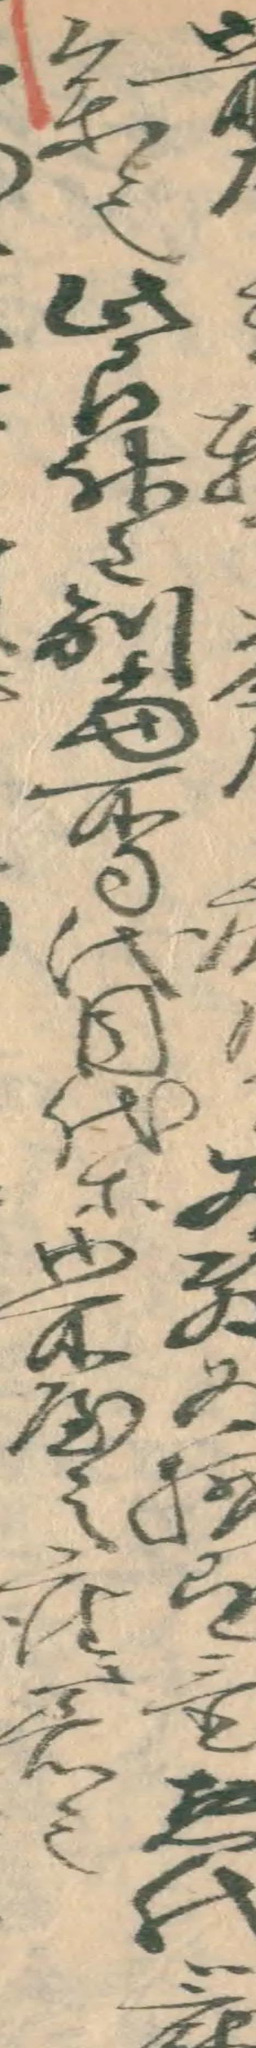参候也此間神主別当所司代目代等御所屋之座ニ着也
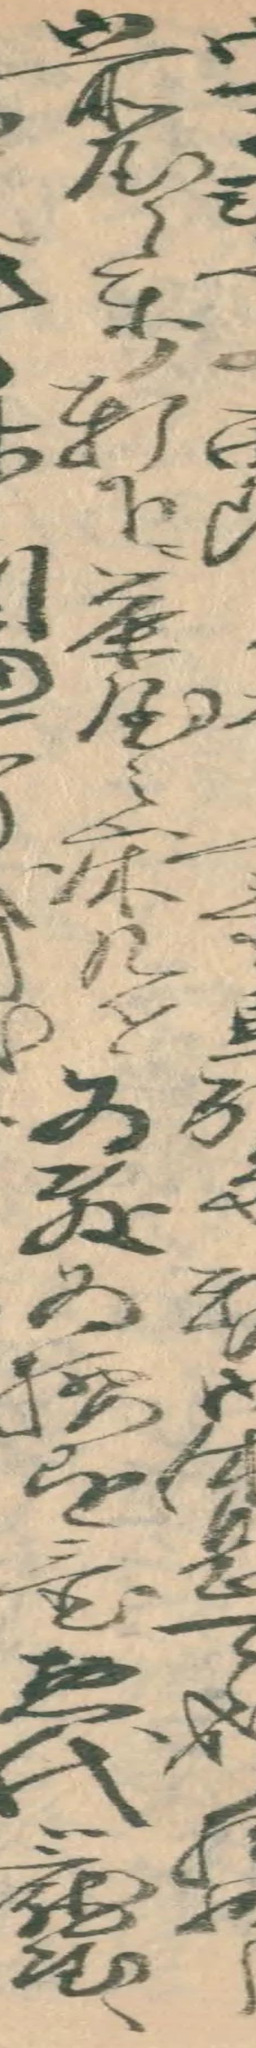御所屋之東ノ軒下ニ茶屋之床几を為敷為腰懸置惣代ハ庁屋へ
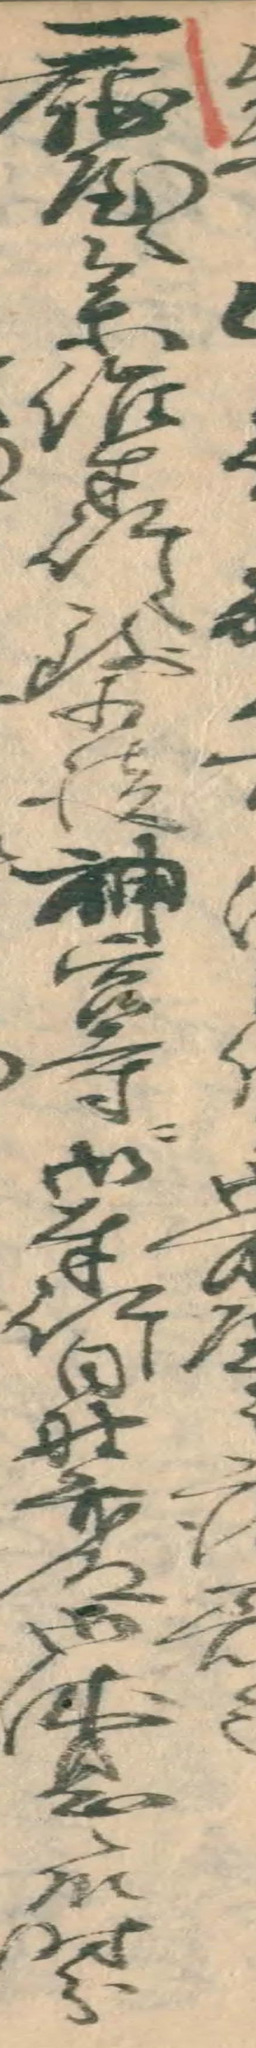一庁屋へ参催奉行へ致相談神宮寺ニ御奉行日野弁殿御休息候故時分
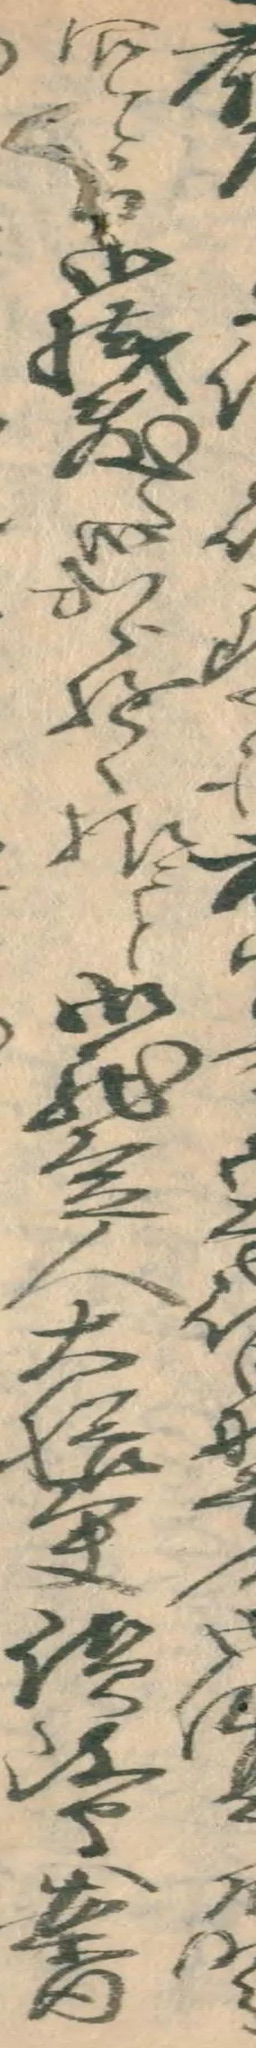宜候間御桟敷へ御出被遊候様ニと御馳走人大膳大夫讃岐守へ案内
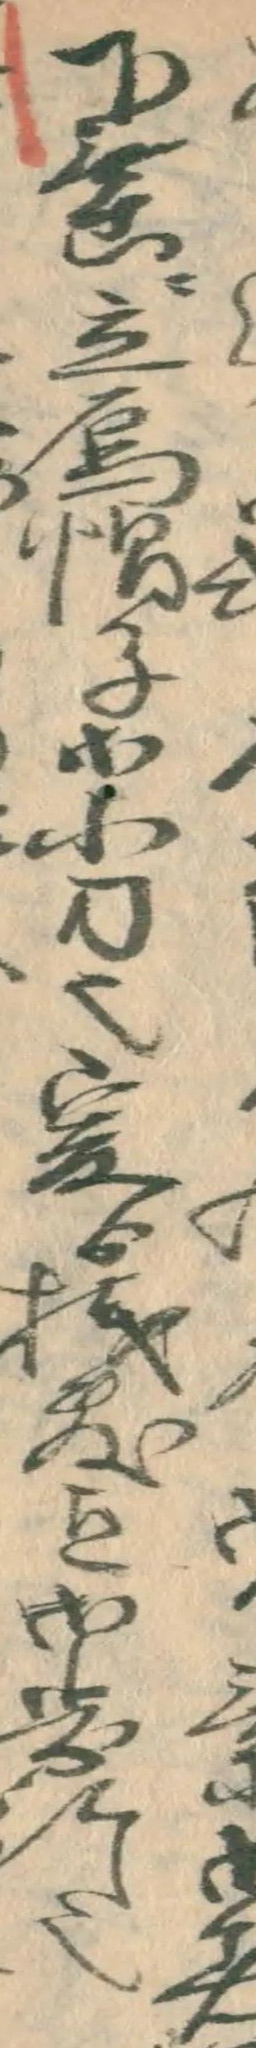下垂ニ立烏帽子御小刀也爰ゟ桟敷迄御歩行也
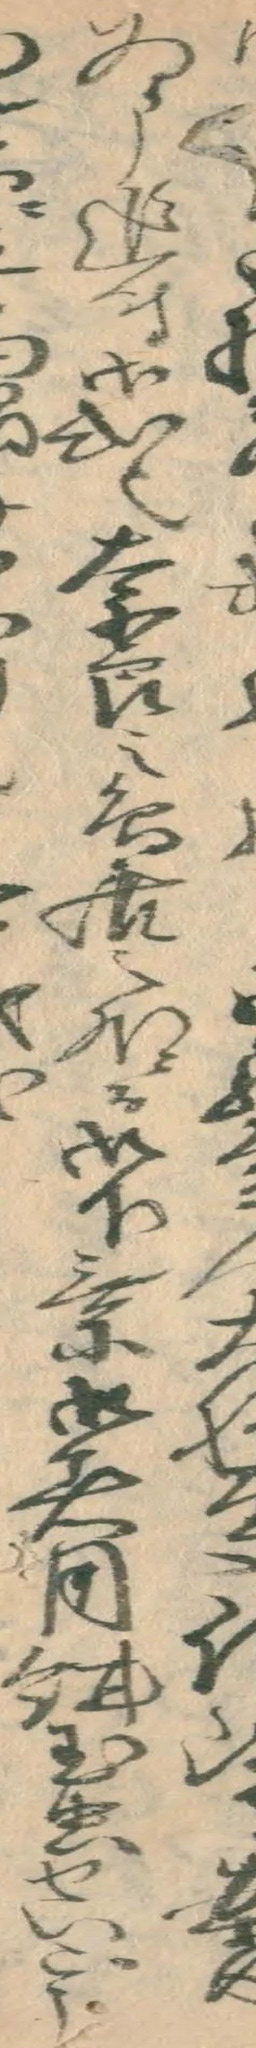為申追付御出也奈良之鳥居之外ニ而御下乗御着用紺玉虫せいごう
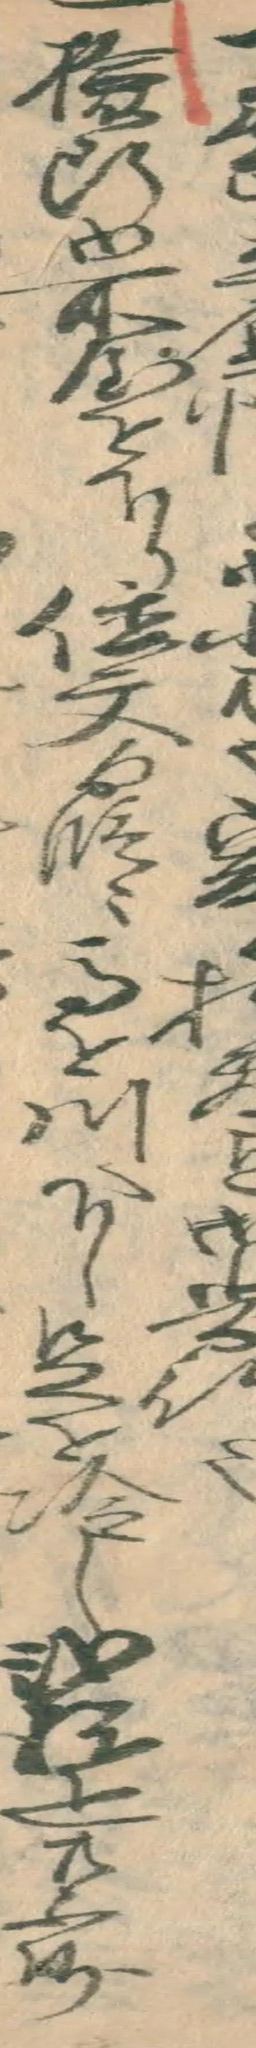一検断御所屋を下り倭文ゟ段々馬を川へ下し足を冷し弐拾疋共不残
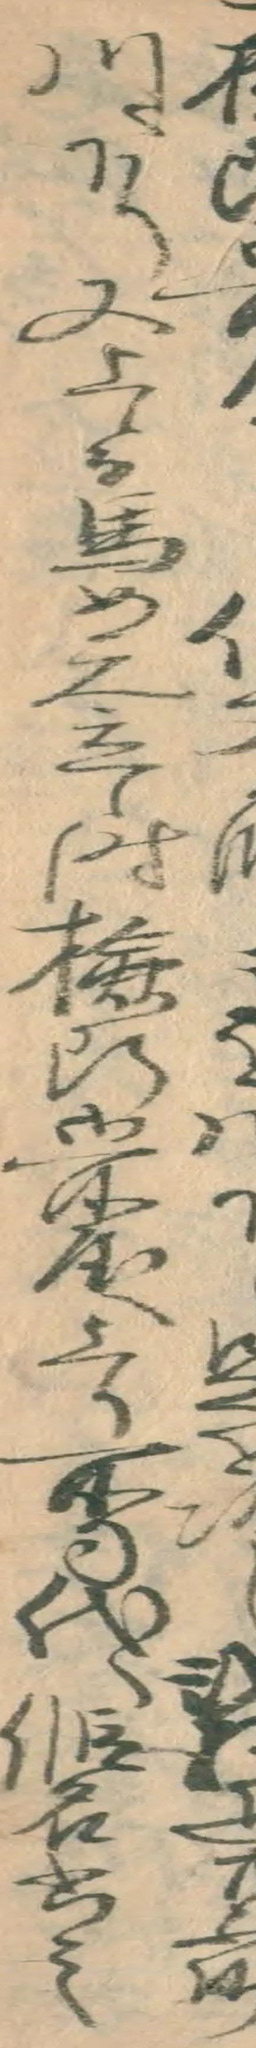川へ下り又上候而馬如元立候時検断御所屋へ上り所司代へ仮名書之

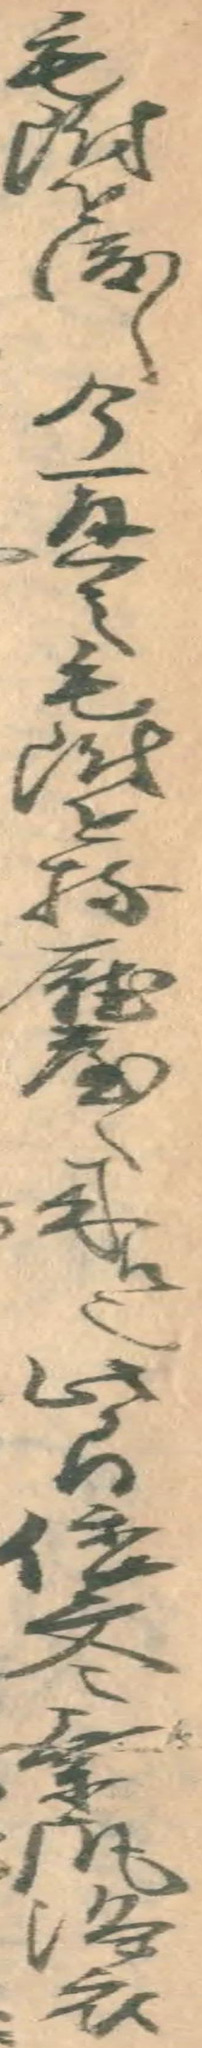毛付を渡し今一通之毛付を持庁屋へ来ル也此間倭文之乗尻浄衣
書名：賀茂社記録. 第58冊
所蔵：国立国会図書館 National Diet Library, JAPAN
